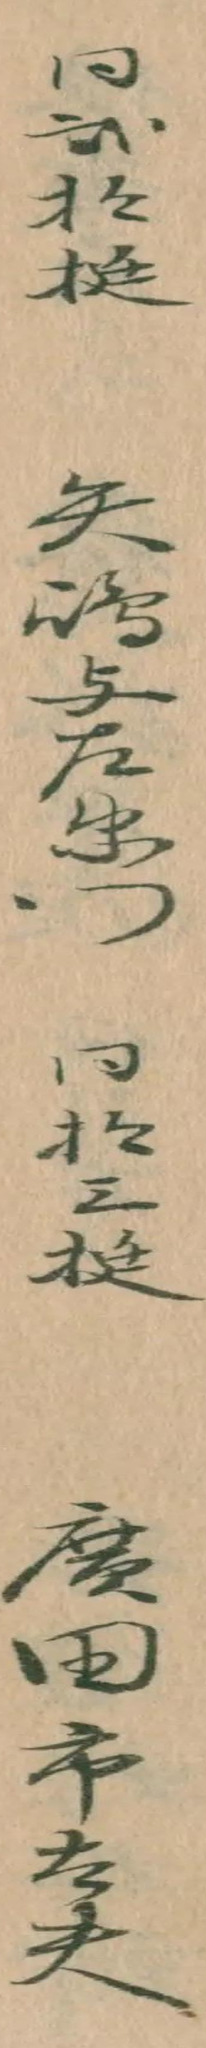同弐拾挺矢島与左衛門同拾三挺広田市太夫
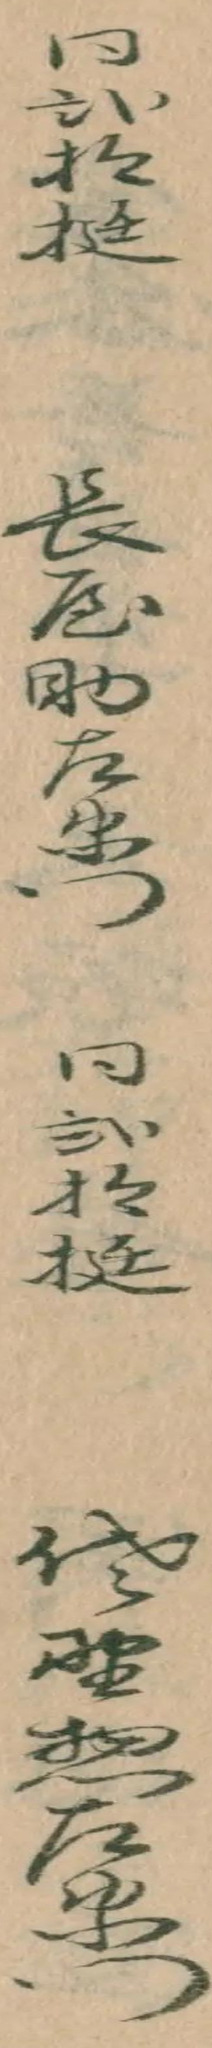同弐拾挺長屋助左衛門同弐拾挺佐野惣左衛門
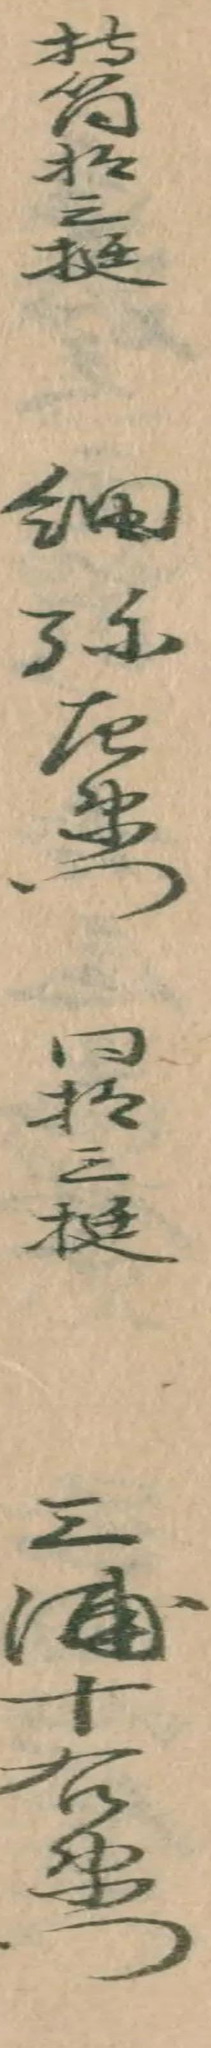持筒拾三挺細弥左衛門同拾三挺三浦十右衛門
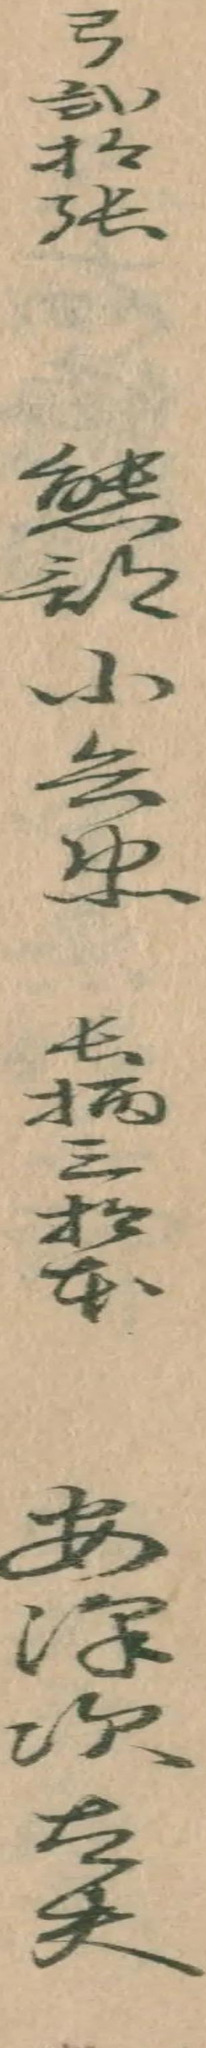弓弐拾張熊部小兵衛長柄三拾本安沢次太夫
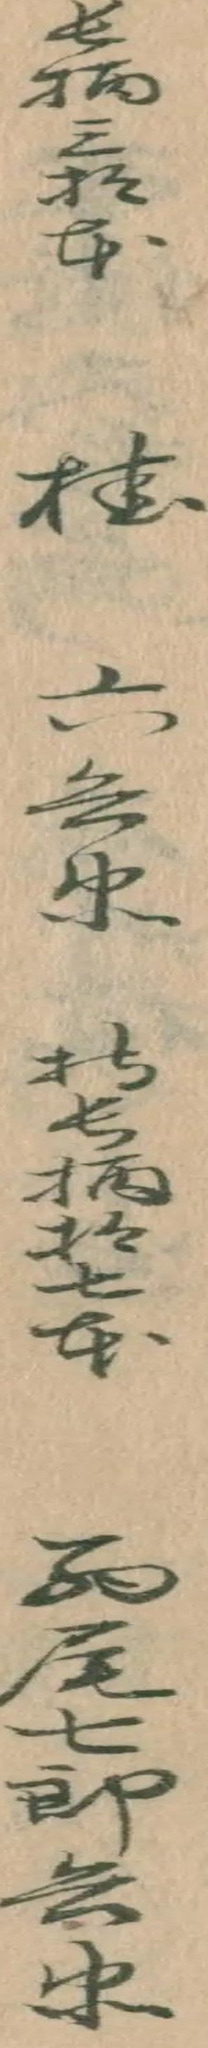長柄三拾本桂六兵衛持長柄拾七本西尾七郎兵衛
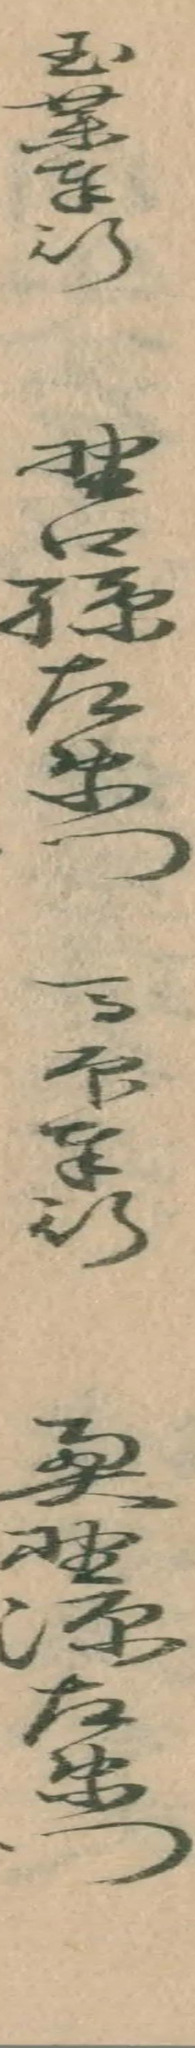玉薬奉行野口孫左衛門馬印奉行奥野源左衛門
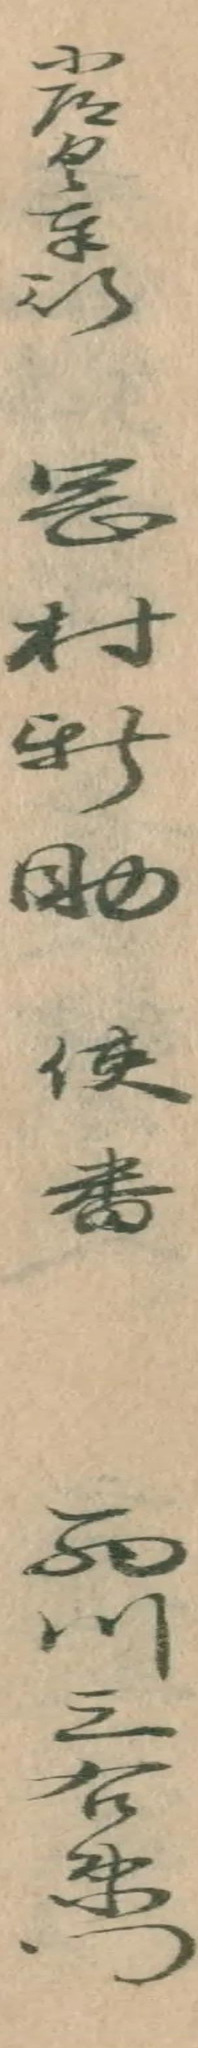小道具奉行岡村新助使番西川三右衛門
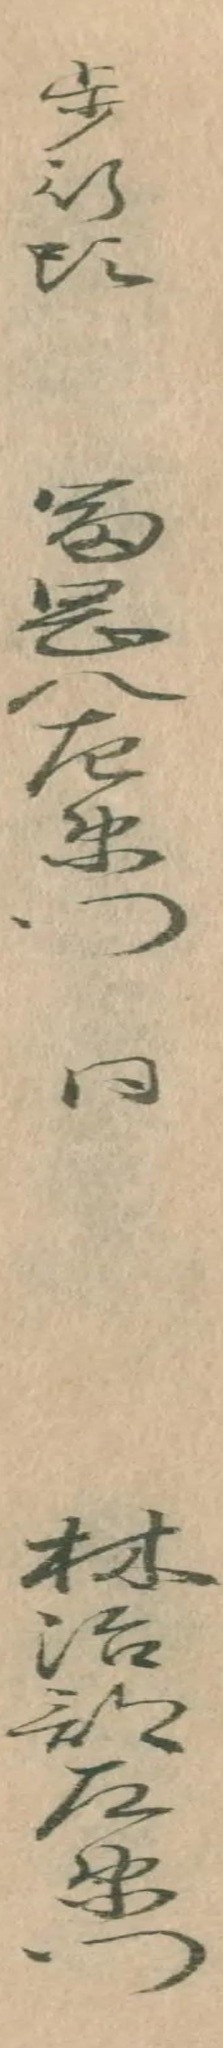歩行頭富岡八左衛門同林治部左衛門
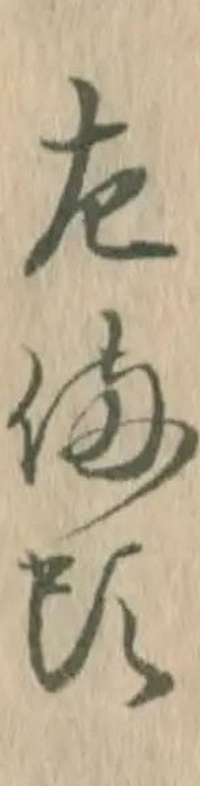左備頭
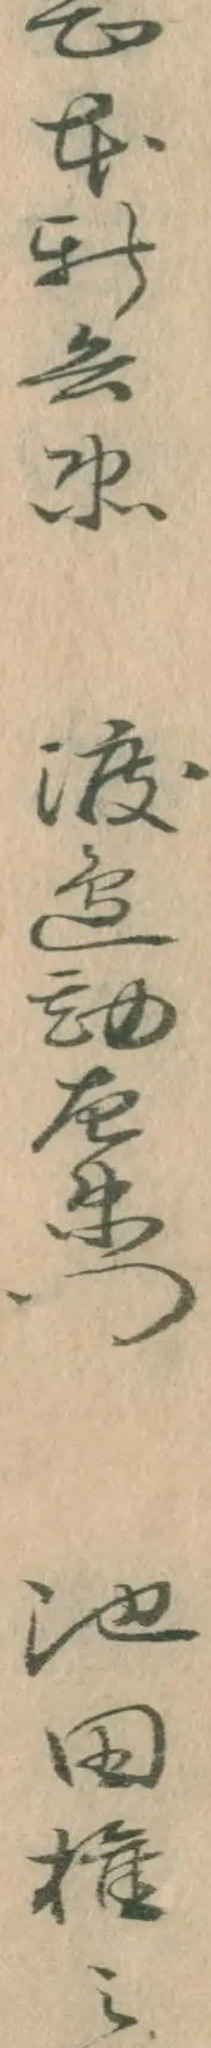岡本新兵衛渡辺勘左衛門池田権之助

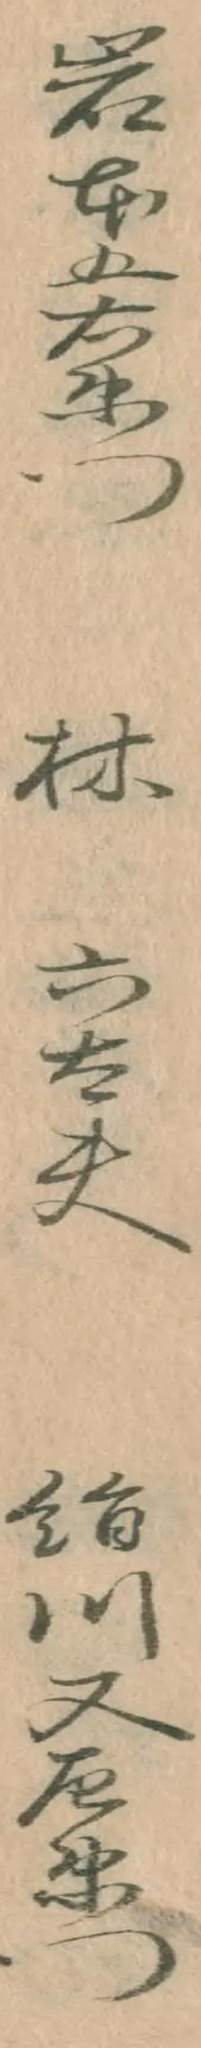岩本五右衛門林六太夫絹川又左衛門
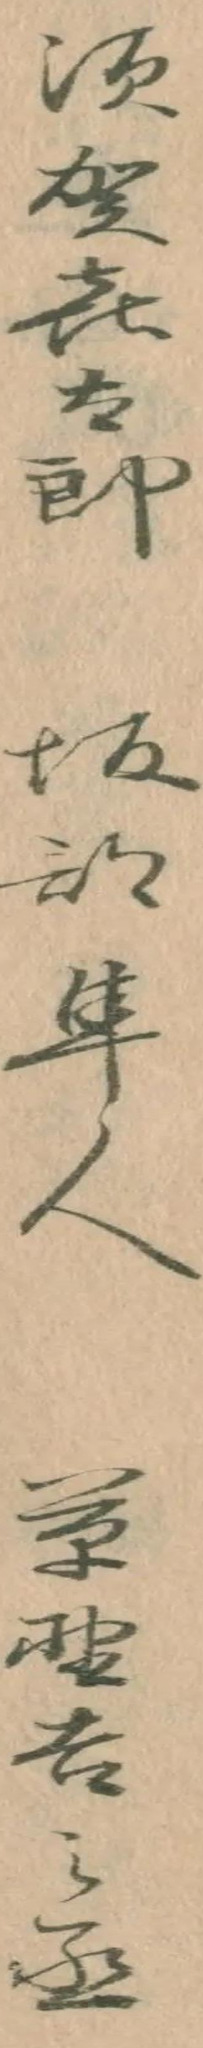須賀喜太郎坂部隼人草野吉之丞
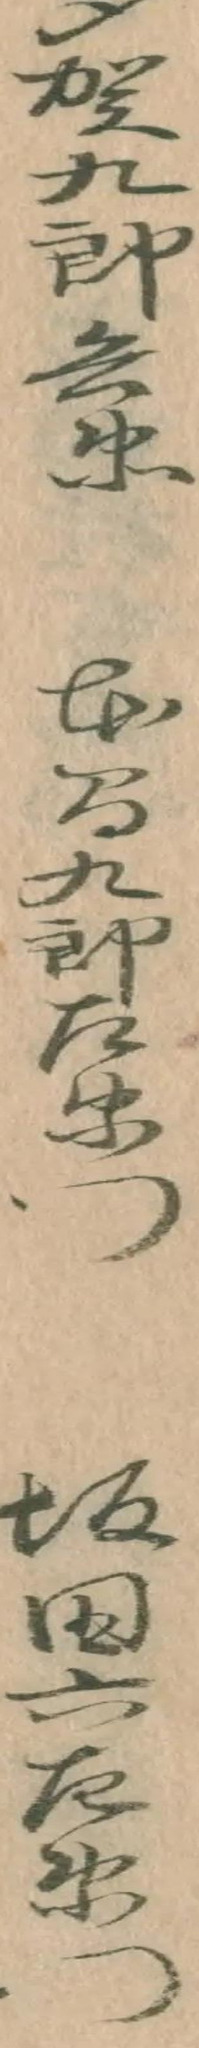多賀九郎兵衛本間九郎左衛門坂田六左衛門
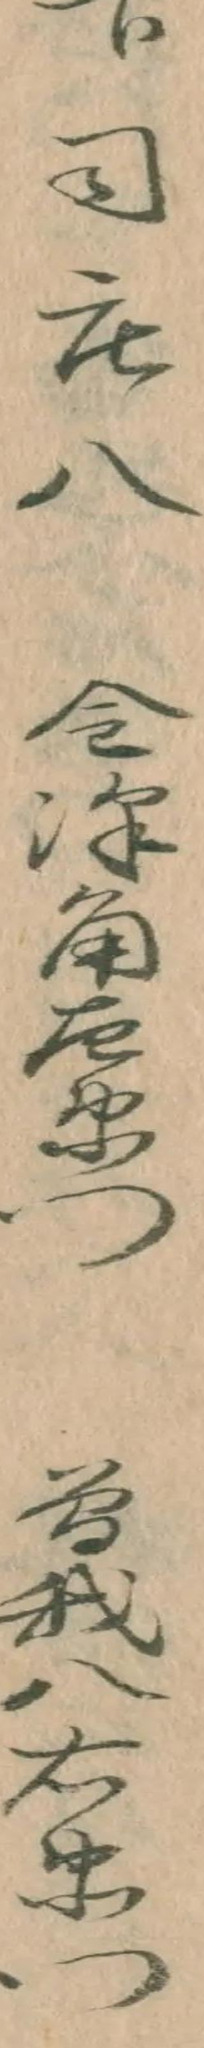下司庄八金沢角左衛門曽我八右衛門
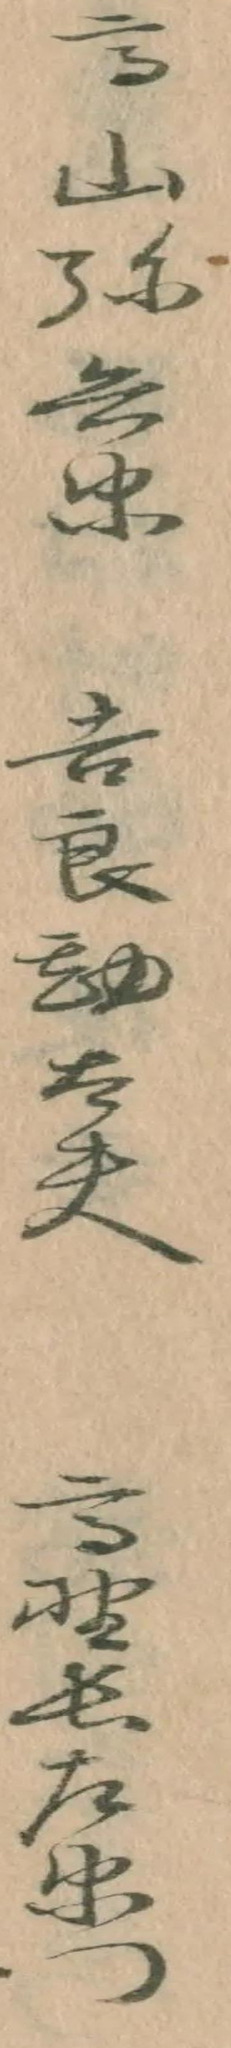高山弥兵衛吉良勘太夫高野長左衛門
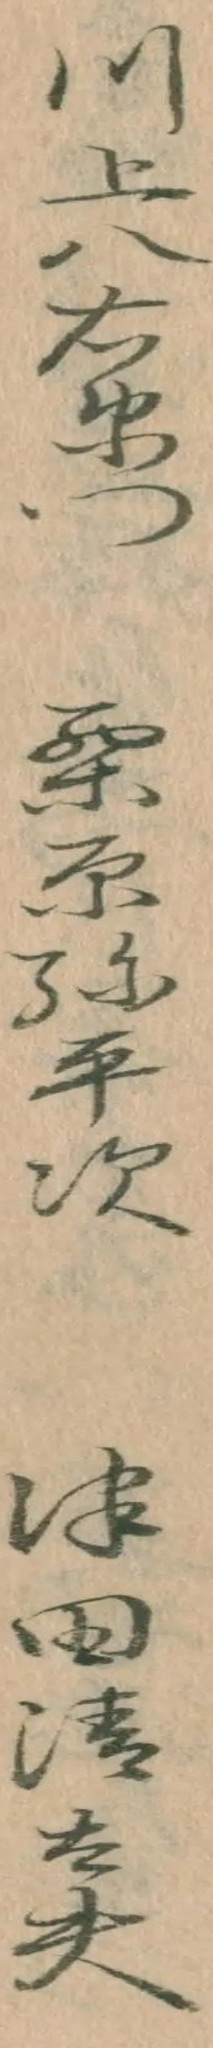川上八右衛門栗原弥平次津田清太夫
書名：切支丹御退治記 49巻. [3]
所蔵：国立国会図書館 National Diet Library, JAPAN
